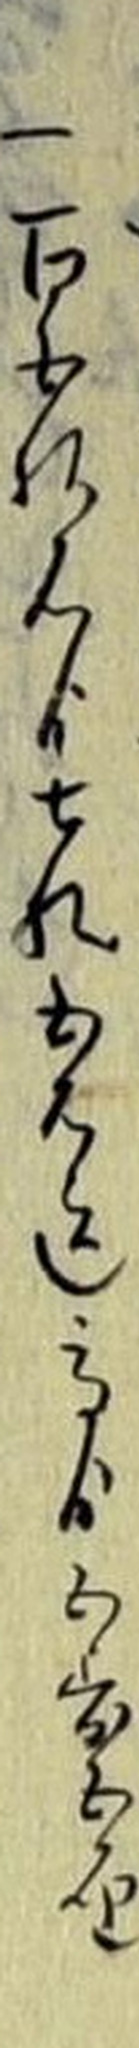一百五拾石ゟ七拾五石迄高ゟ五歩五厘
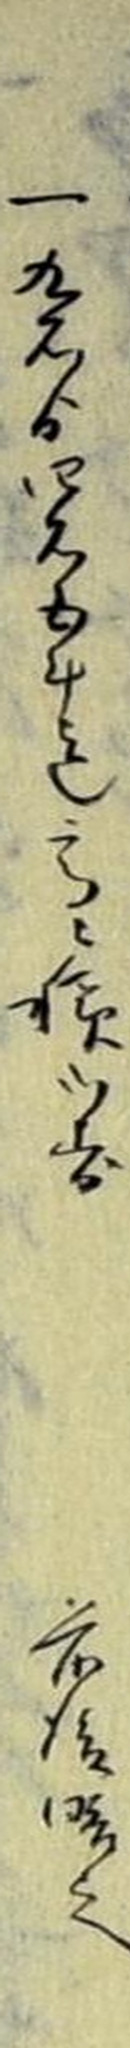一九石ゟ四石五斗迄高に積弐歩前後略之
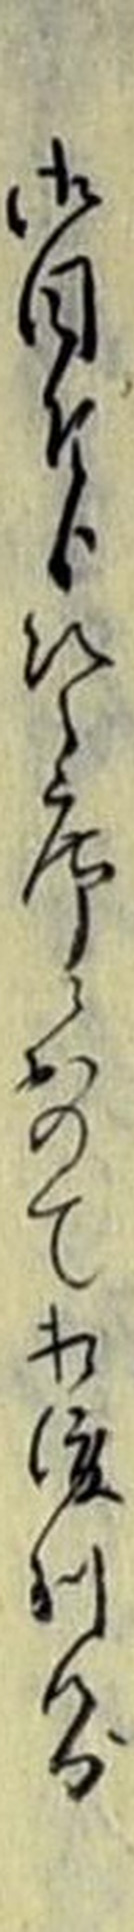御目付ゟ次之席におゐて相渡別紙
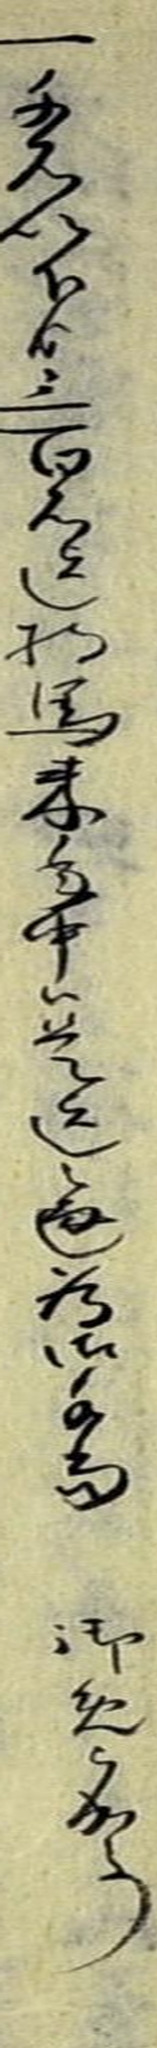一千石以下ゟ三百石迄持馬来年中は是迄之通為御手当御免被成事
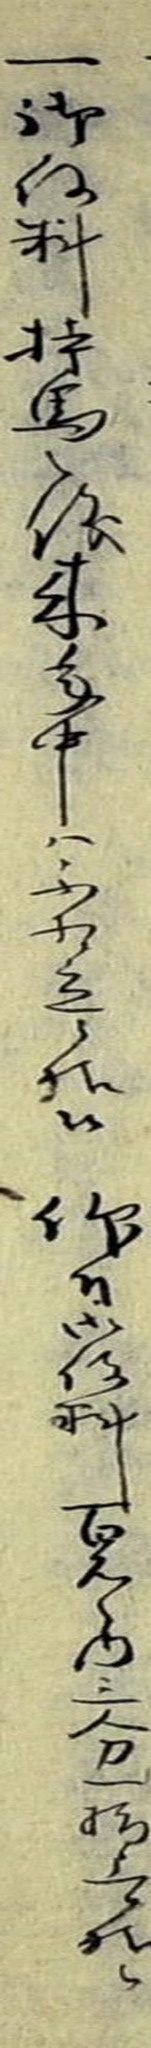一御役料持馬之儀来年中は不相立候様被仰付御役料百石之内三分一指上候様被
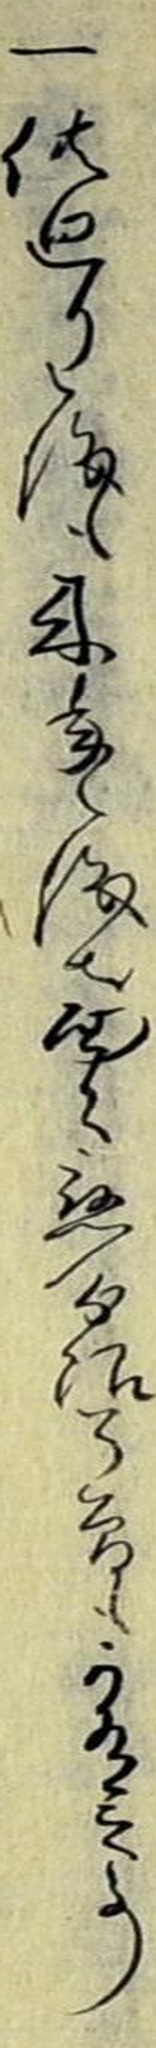一供廻り之儀も来年之儀は面々応分限了簡も可有之事
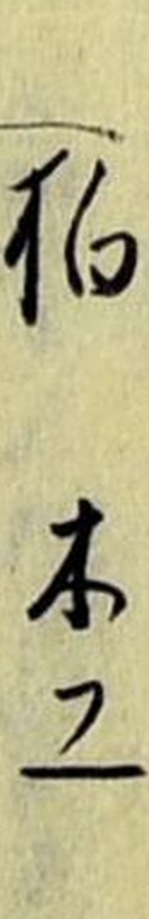狛木工

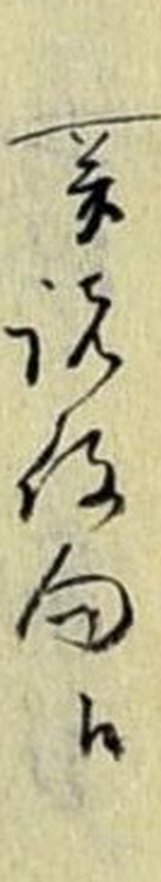并諸役向え
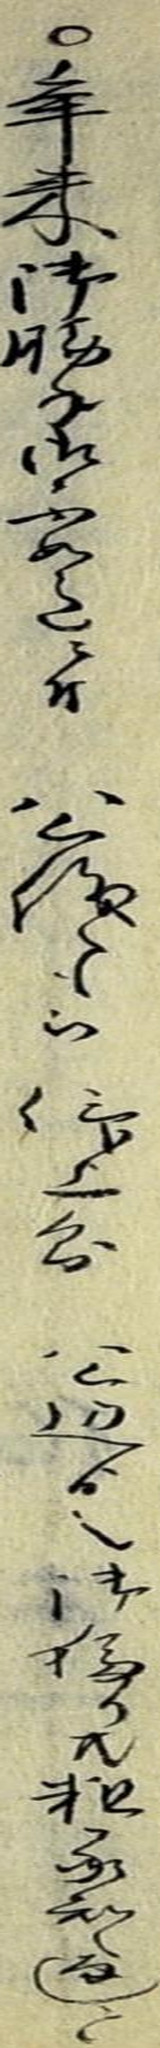〇年来御勝手不如意に付公儀へも被仰上則公辺ゟ之御移り共粗承知之通に候
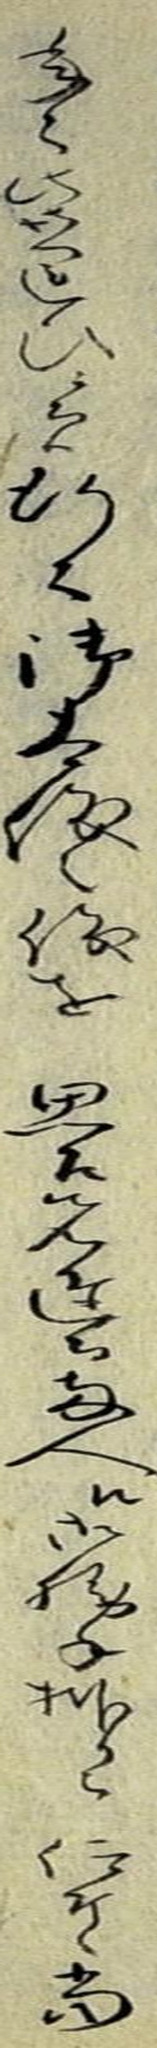年々此御運ひに而は行々御太儀之儀を思召先達而両人え御勝手掛り被仰付候当
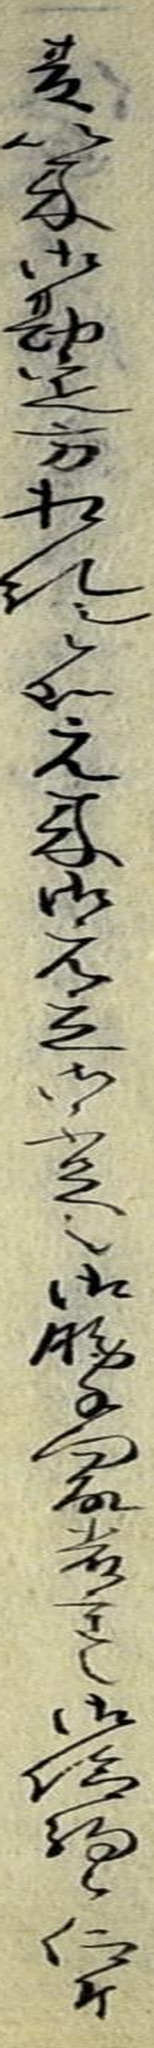夏以来御勘定方相糺し候処元来御取立御不足之御勝手向故厳重之御倹約被仰付
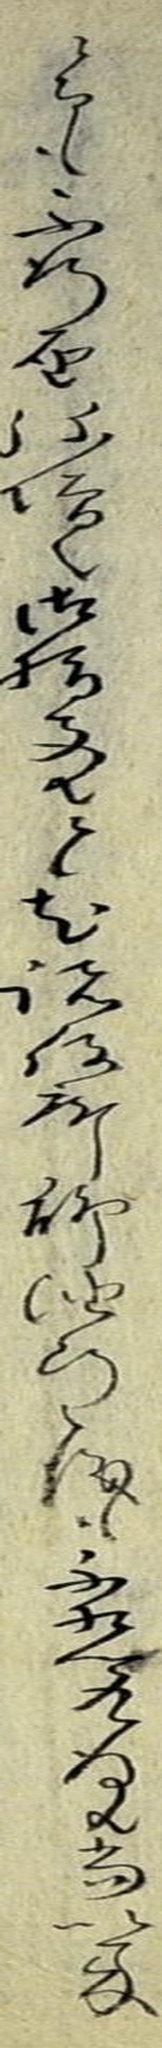に而も不行届弥増之御指支共に候尤諸役所聊油断之儀も不相聞候得共尚以来
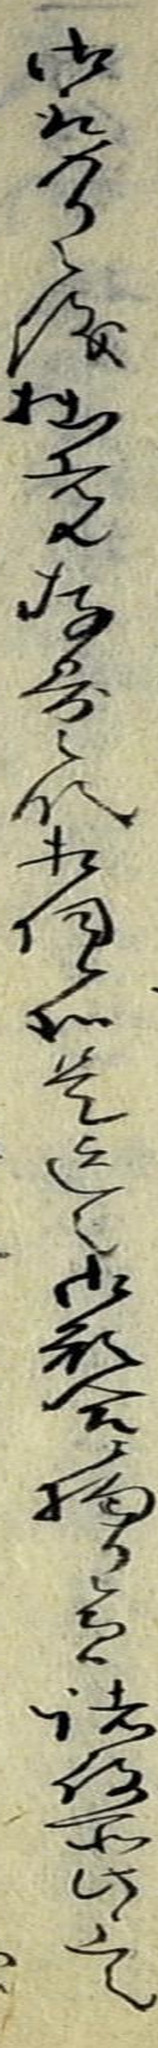御取〆り之儀拙者共存寄之段相伺候処是迄之御形合に拘り候而は諸役所此上之
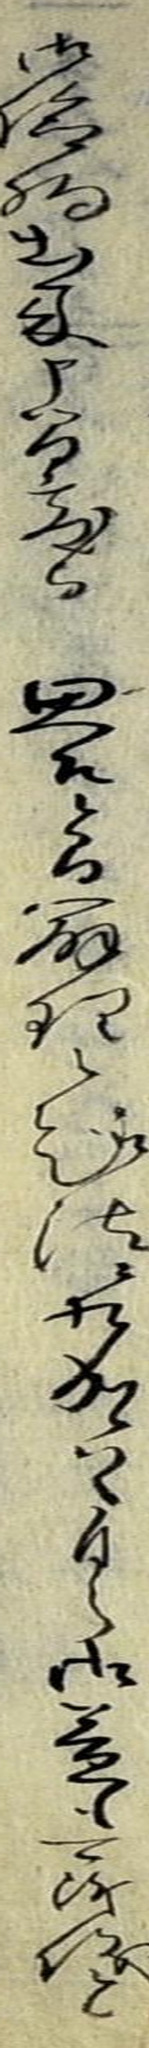御倹約出来申間敷与思召候間弁理之趣法に相成候はゝ自ら御益も可附儀に候
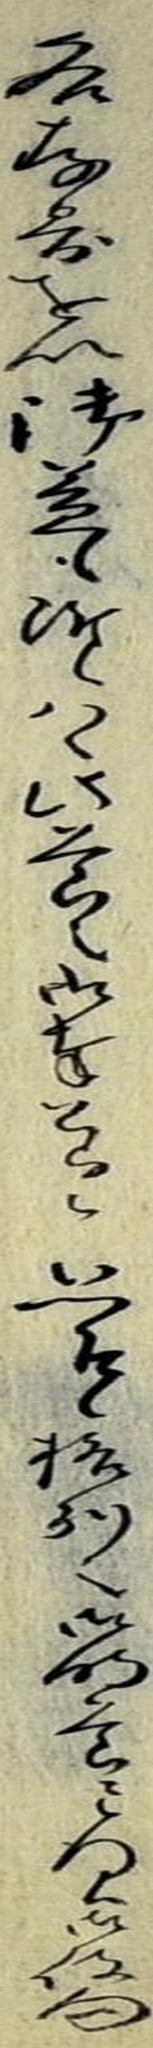各存寄を以御益も附候はゝ此節之御奉公与被思召候格別之御時節に候得は御役向
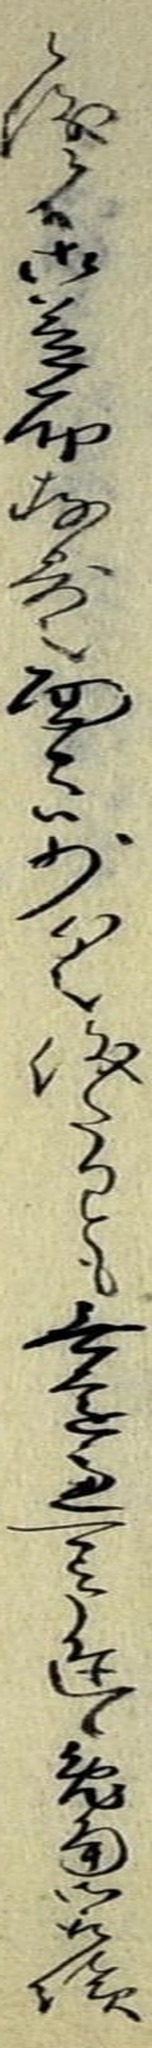之儀に付御益筋存寄之面々は少分之儀たりとも無遠慮可被申達候兎角御取続
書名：命令之部 二
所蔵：福井県文書館 Fukui Prefectural Archives
